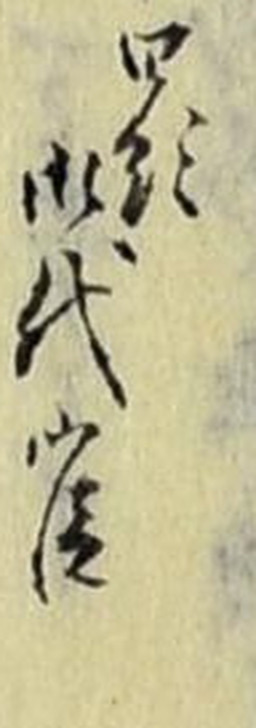御代官
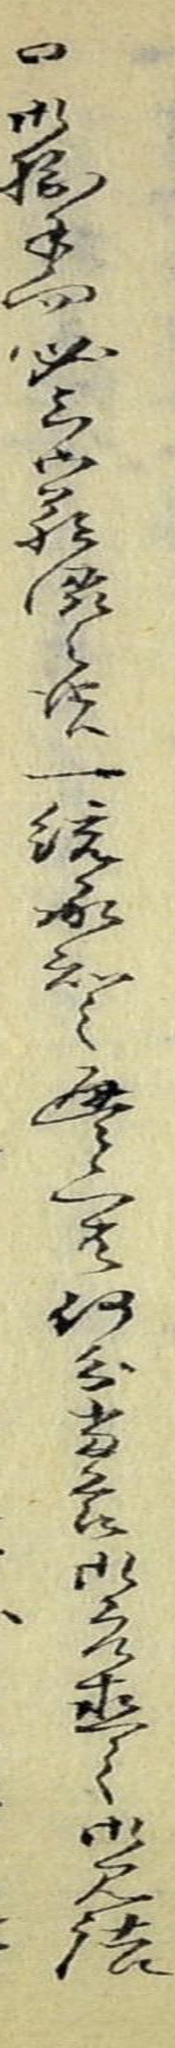○御勝手向必至難渋之儀一統承知之通りに候へ共何分当節御取直之御見詰
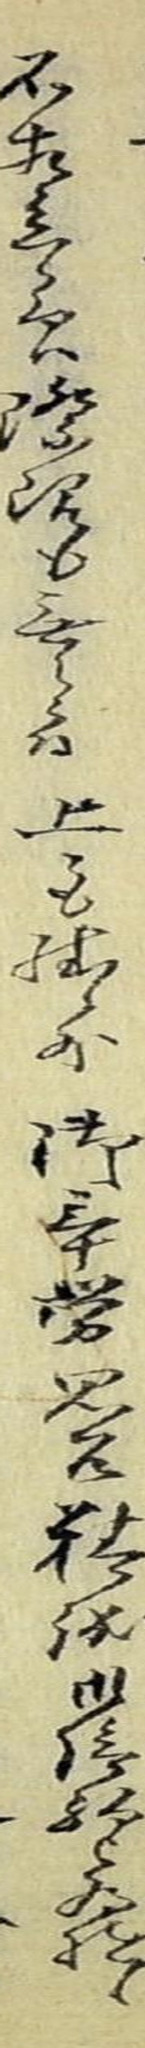不相立候而は際限も無之候に付上にも殊之外御辛労思召精誠御倹約被為遊候
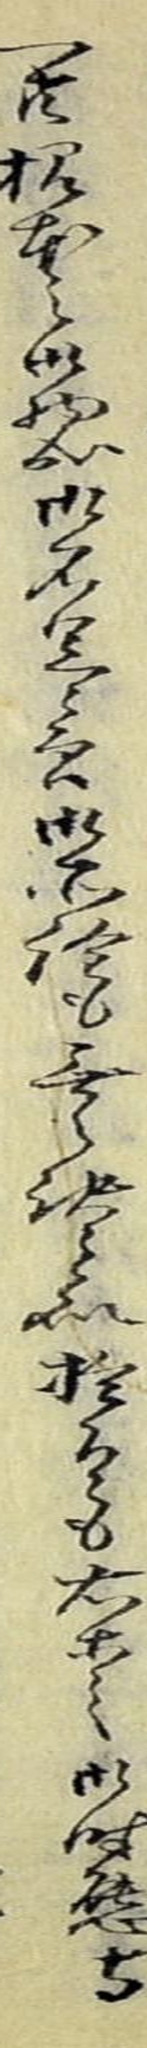へ共根本之御物成御不足候而は御所詮も無之訳に候処於下々も右等之御事態専
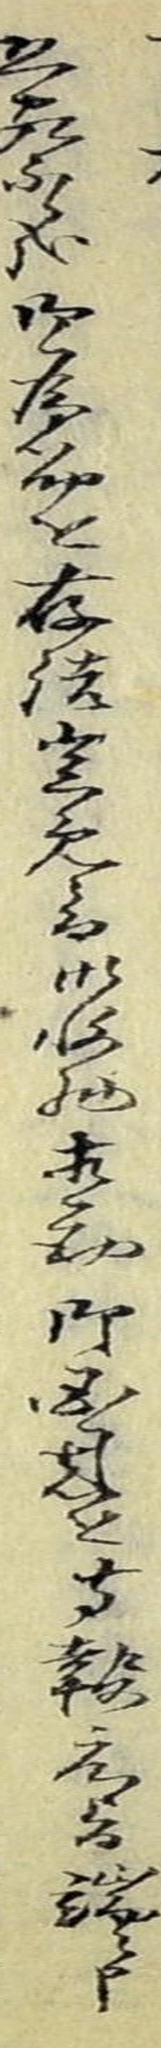恐察候哉御為筋を存詰定免に而御収納相勤御国恩を専報度旨端々申
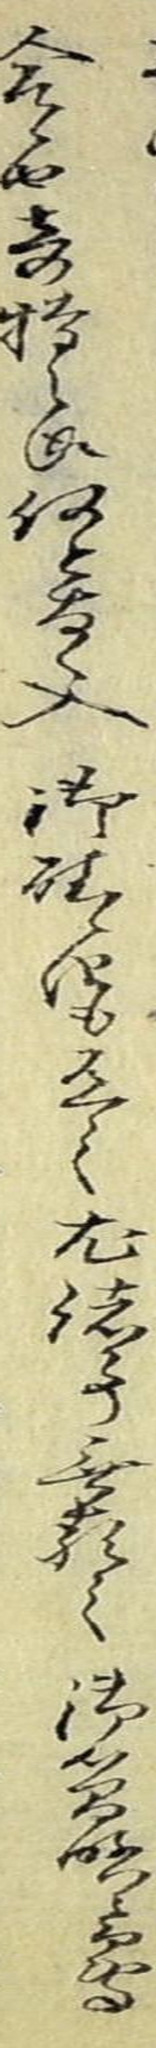合候由奇特之儀何となく入御聴候之儀も有之尤諸事無類之御簡略に而専
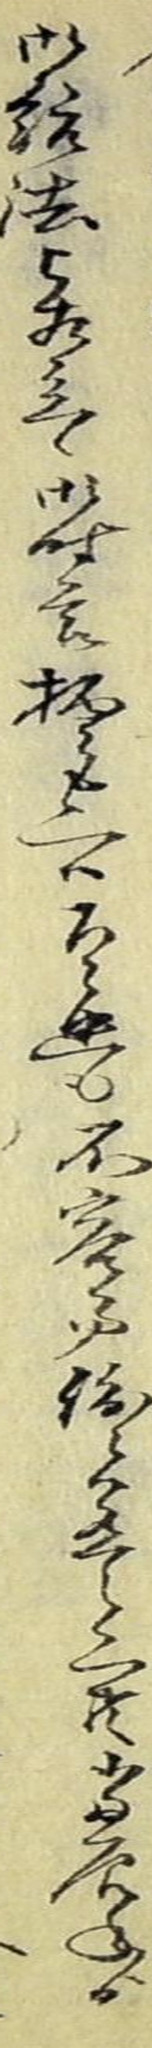御趣法被相立候御時節柄にも候へは下々迚も不容易儀には有之候へ共当辰年ゟ
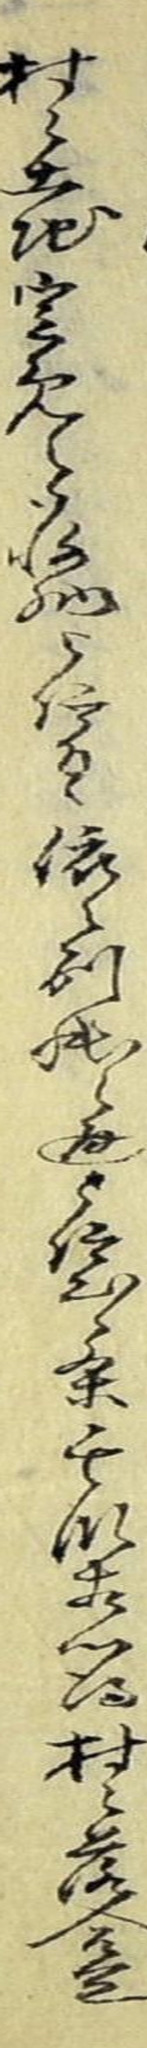村々土地定免之御収納被仰付候依之別紙之通被仰出候条其段相心得村々落合宜
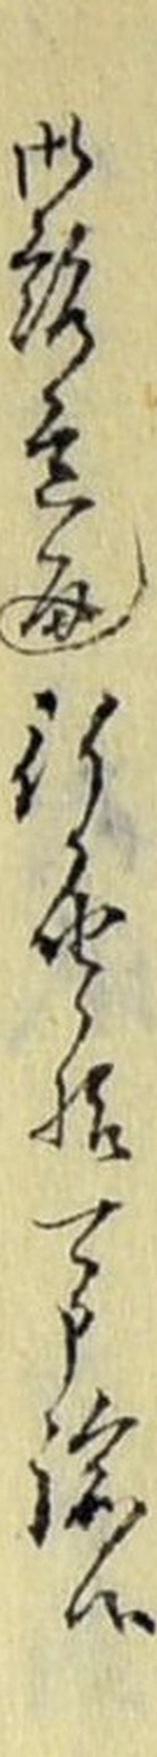御趣意通行届候様可申渡候

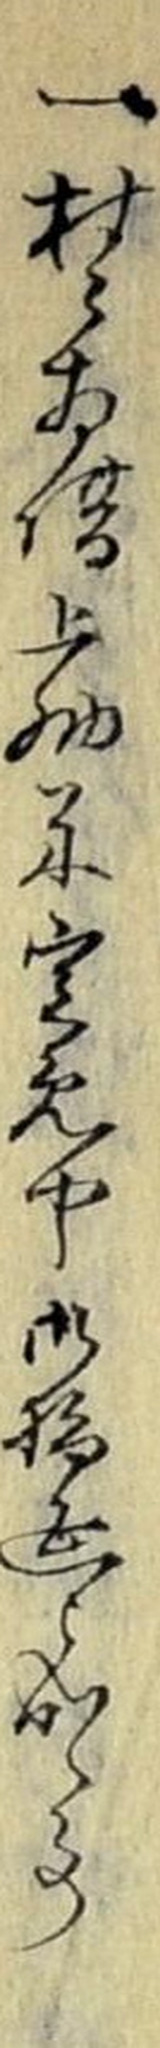一村々拝借上納米定免中御指延被成候事
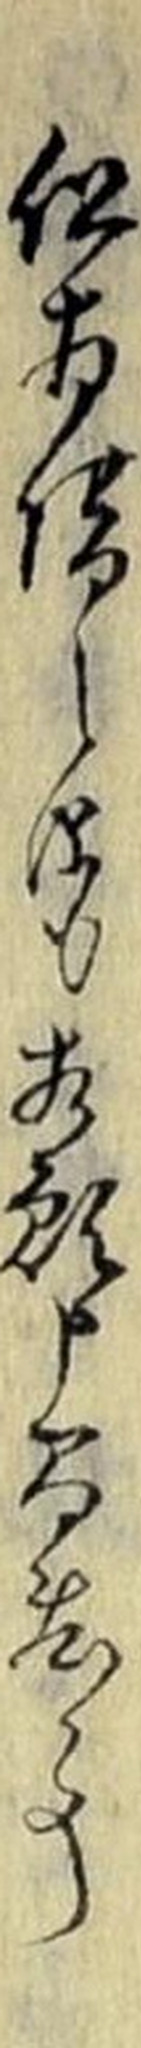但拝借之儀も相願申間敷事
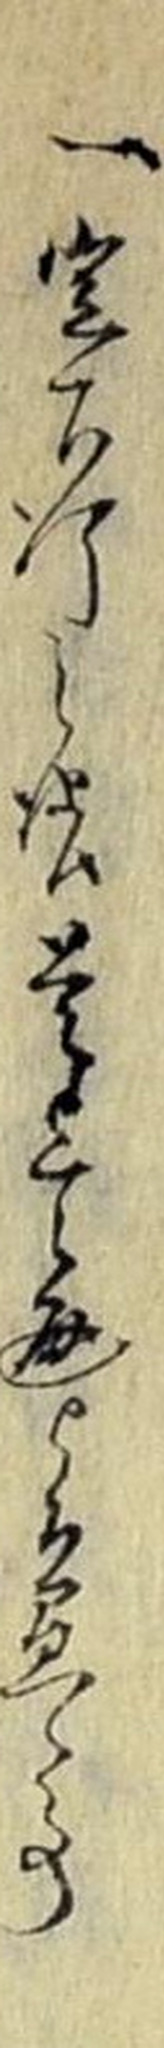一定下行之儀は是迄之通被下置候事
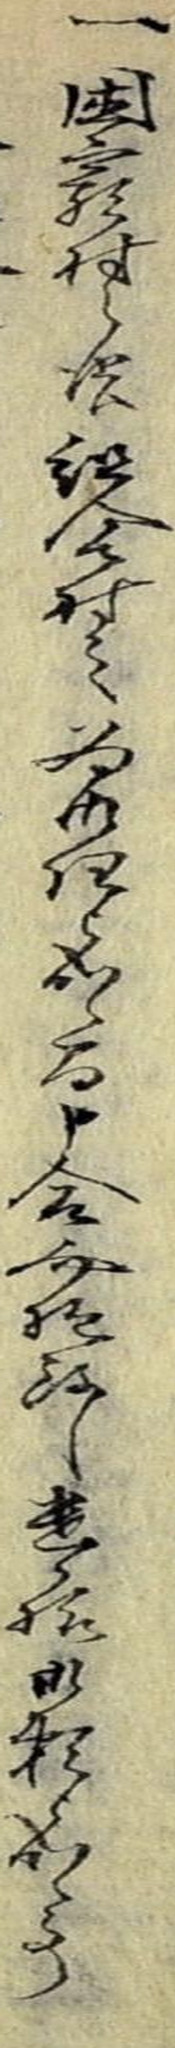一困窮村之儀は組合村々へ為御任被成候間申合介抱致し遣候様御頼被成候事
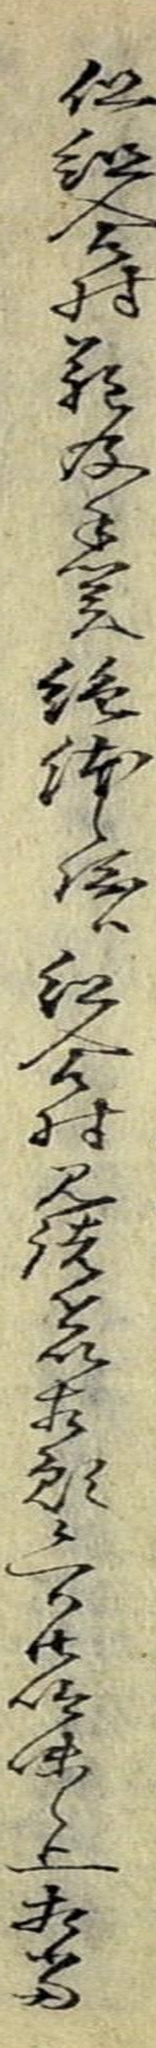但組合村難及年関絶体候儀は組合村見詰を以相願候へは御吟味之上相当
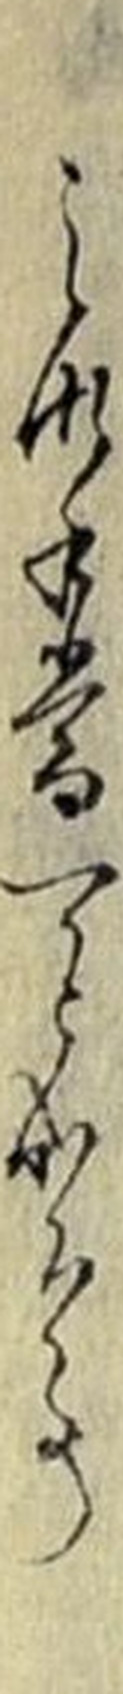之御手当可被成下候事
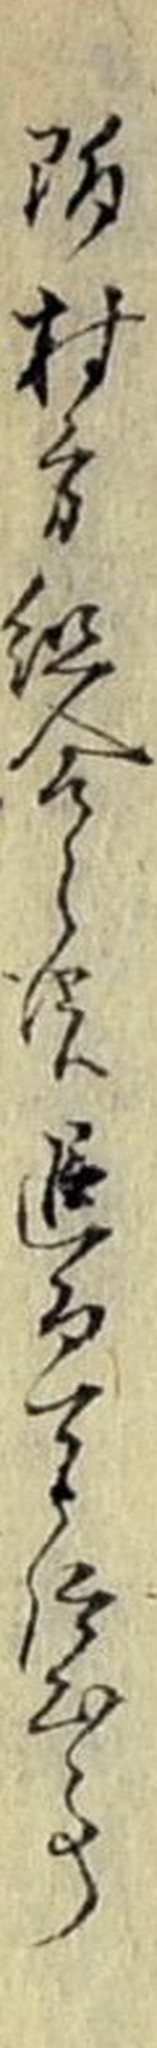附村方組合之儀は追而可被仰出事
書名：命令之部 六
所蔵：福井県文書館 Fukui Prefectural Archives
